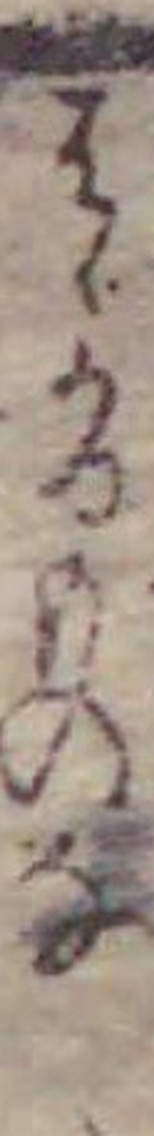はばかるものな
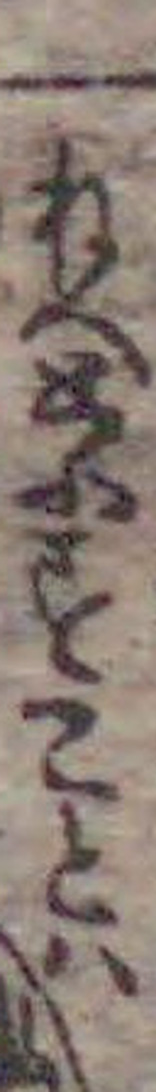ねへとふすことは
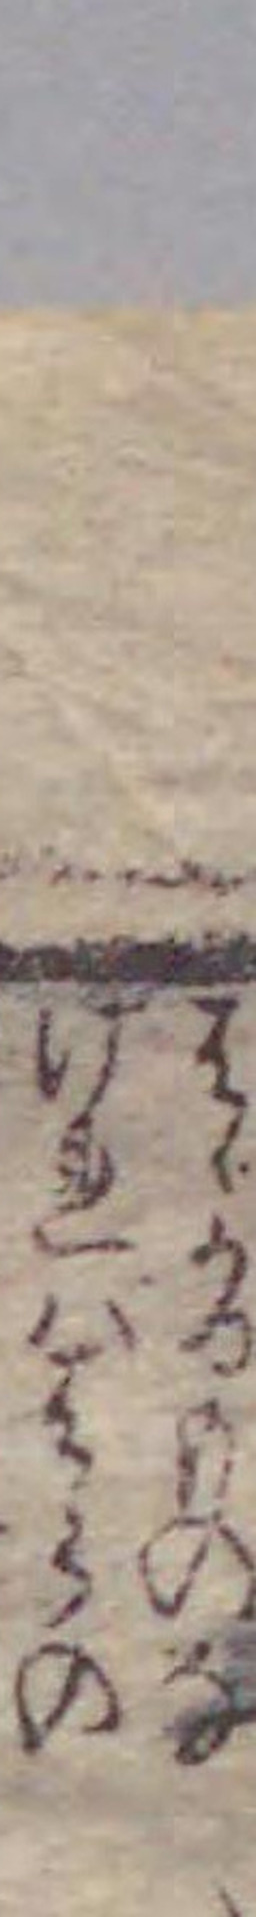ければはらの
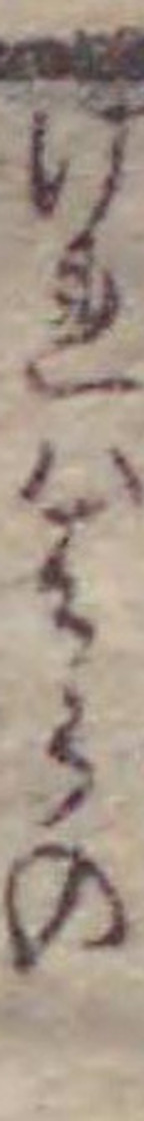ければはらの
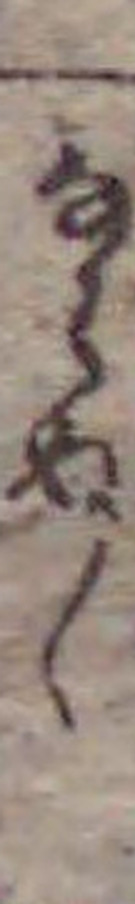ならぬ〳〵
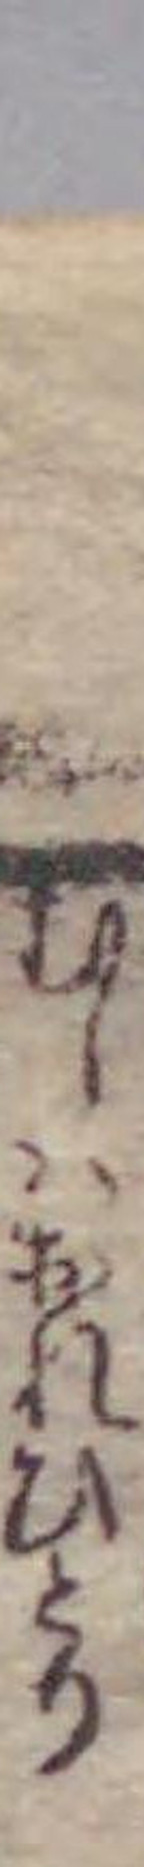むしはおれひとり
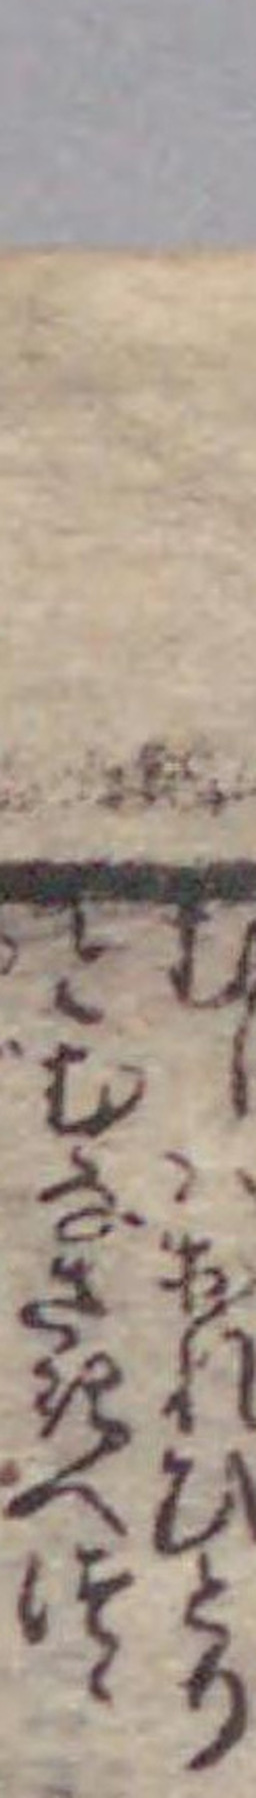とむなさきへつゝ
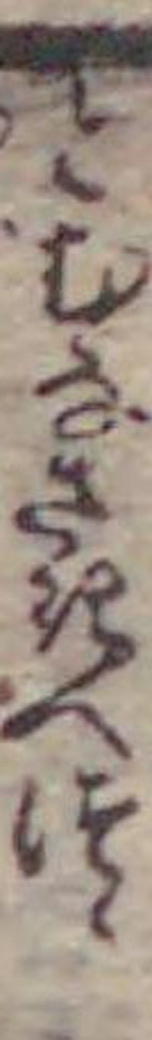とむなさきへつゝ
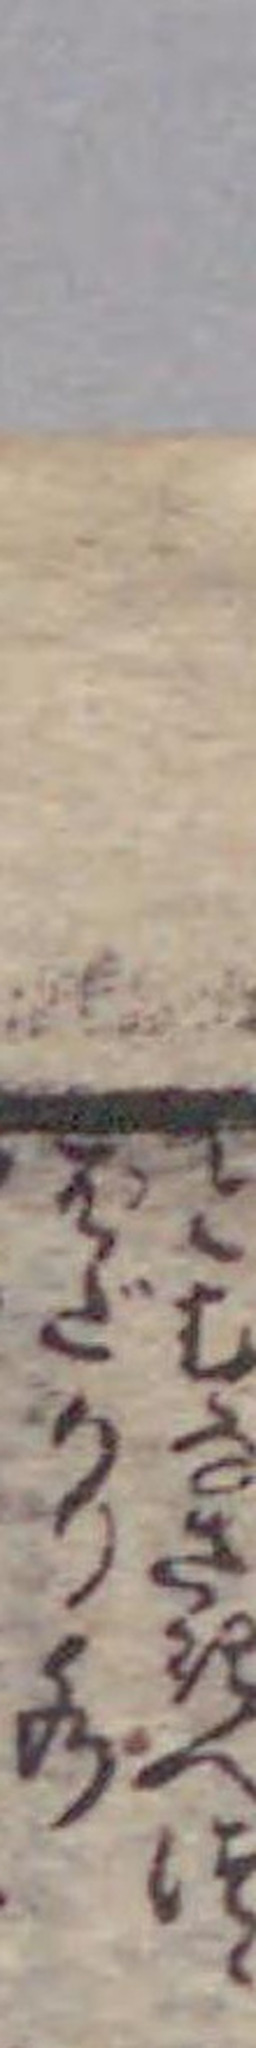はだかり水
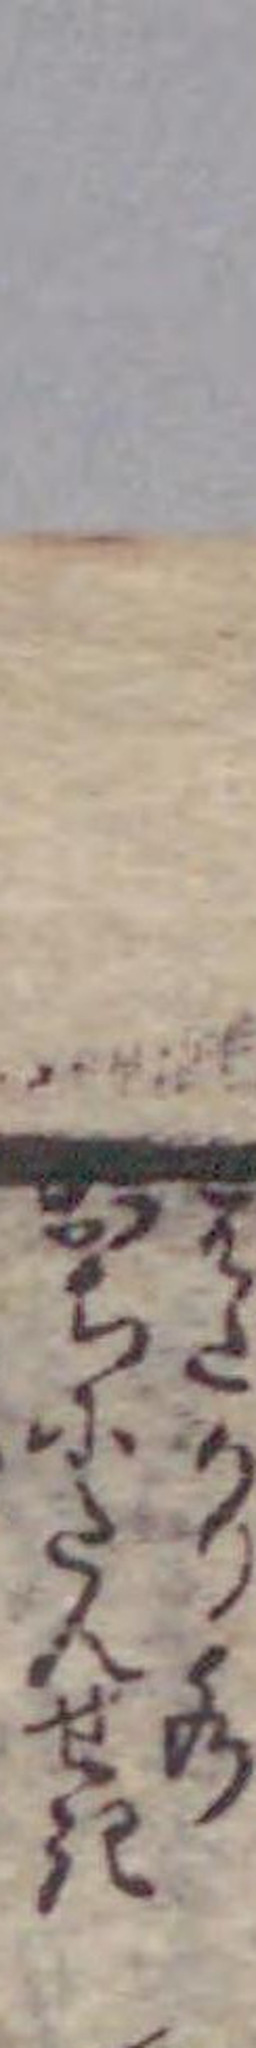おちにたんせき
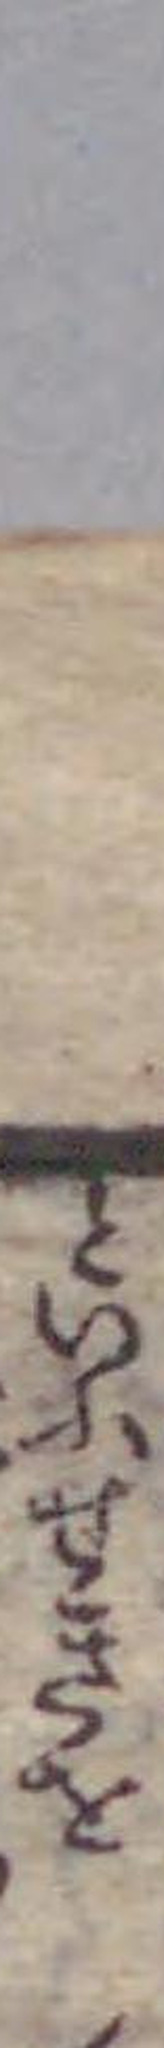といふせきを
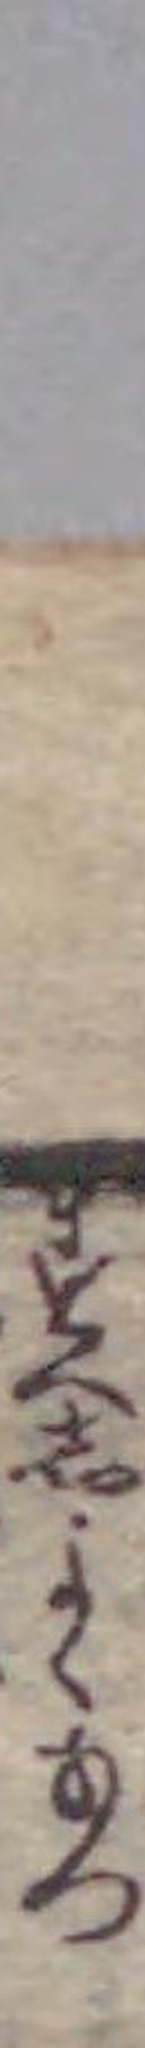すへしよくもつ
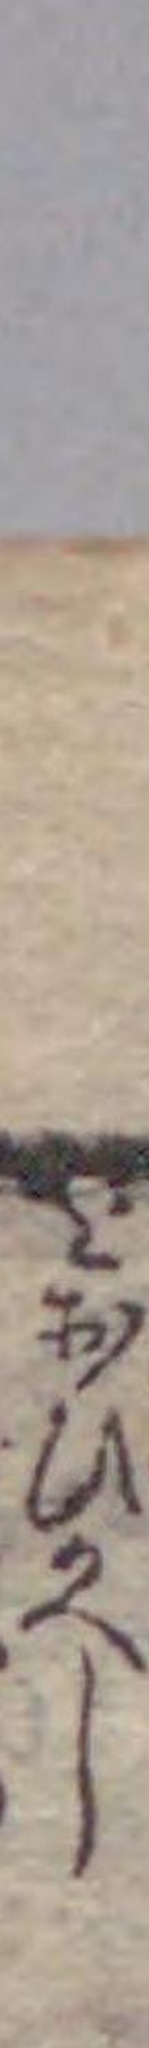をおひかへし
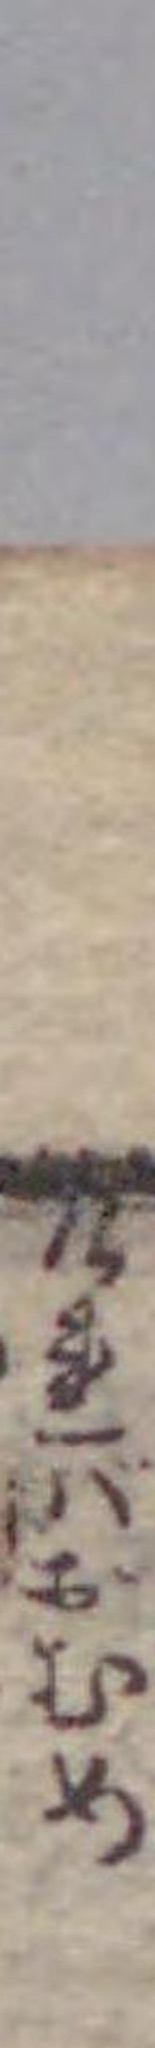ければおむめ
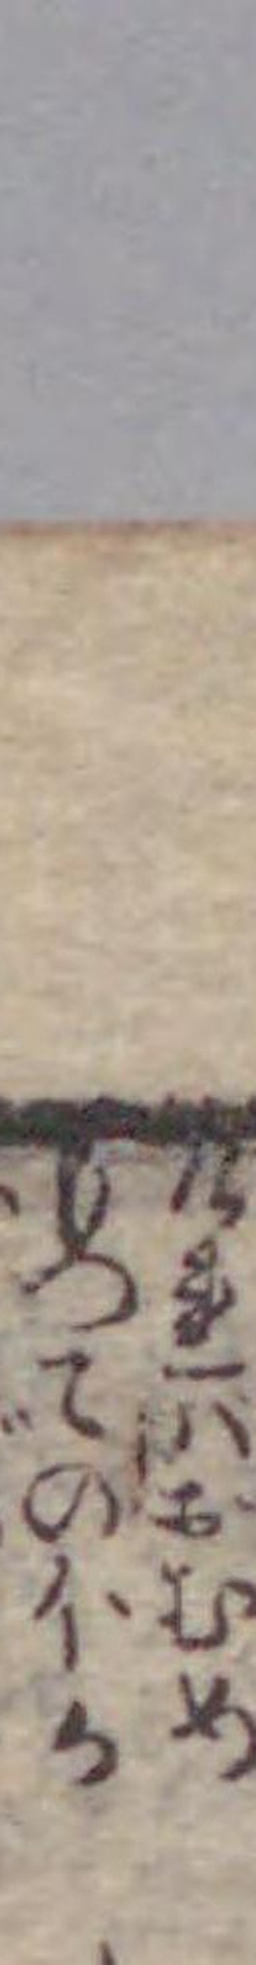もつてのほか
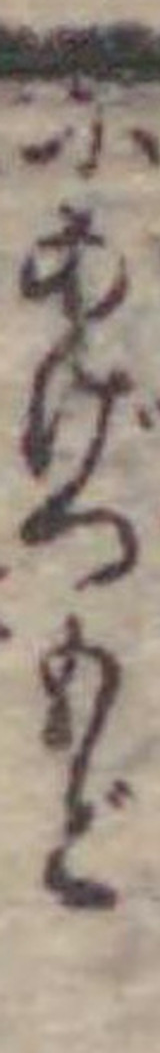にあげつもど
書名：鼻下長生薬 : 3巻
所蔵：国立国会図書館 National Diet Library, JAPAN
